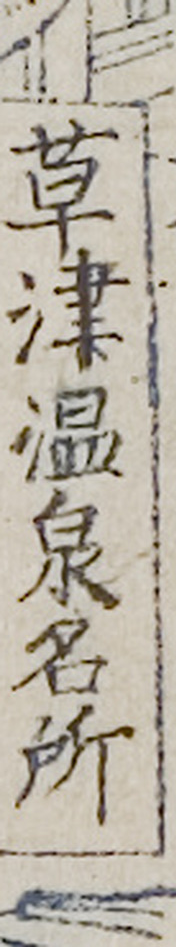草津温泉名所
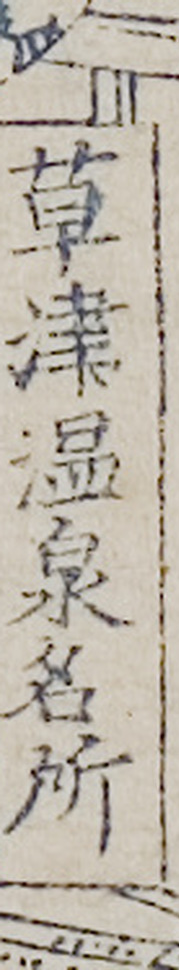草津温泉名所
